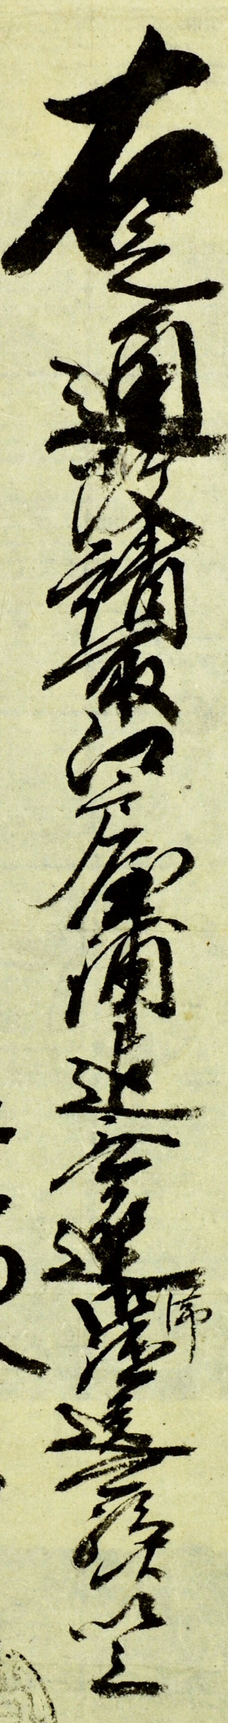右之通改請取江戸屋敷迄無違御継送可給候以上
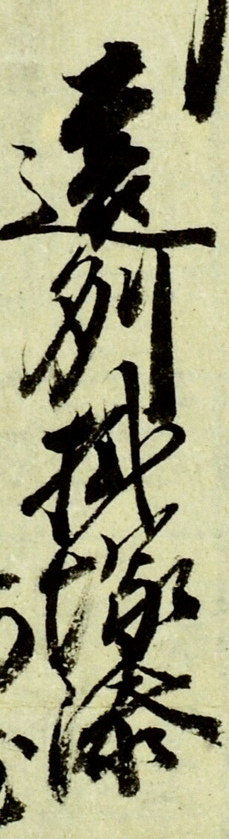遠州掛塚湊
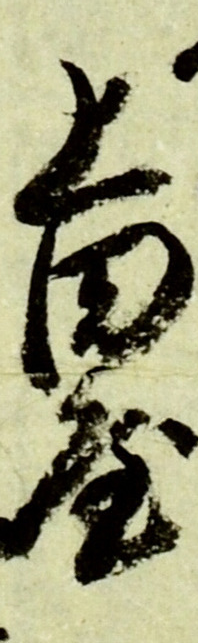上田屋
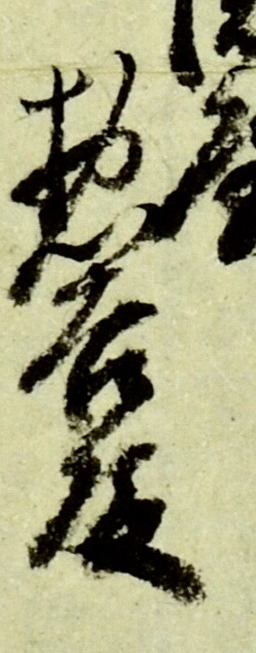惣吉殿

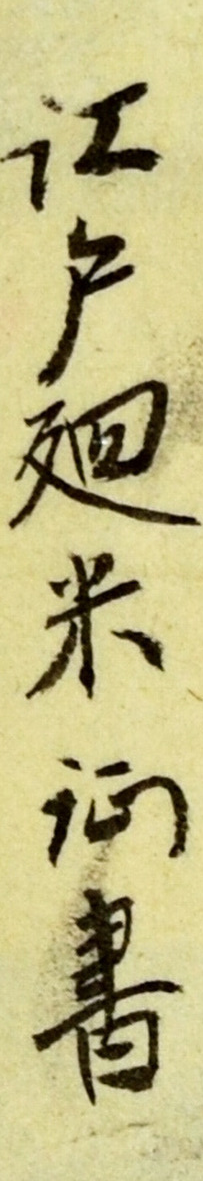江戸廻米証書
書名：覚
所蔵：伊那市立高遠町図書館・合同会社AMANE
